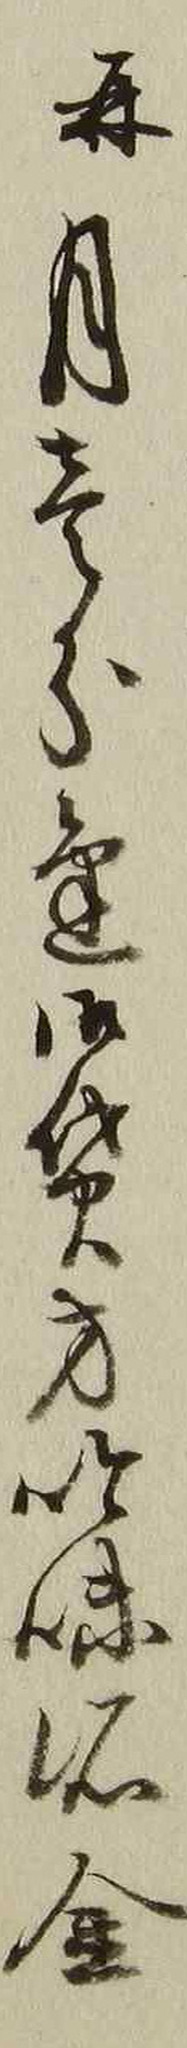并月壱分金御貸方吟味所金
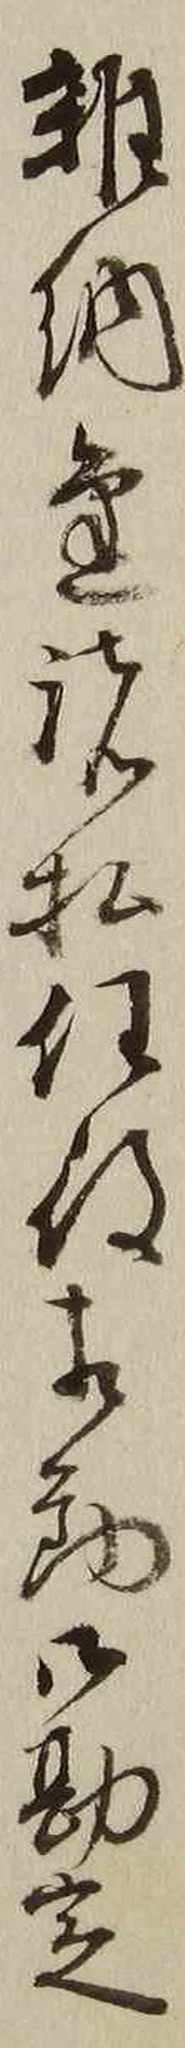雑納金諸払任役相勤御勘定
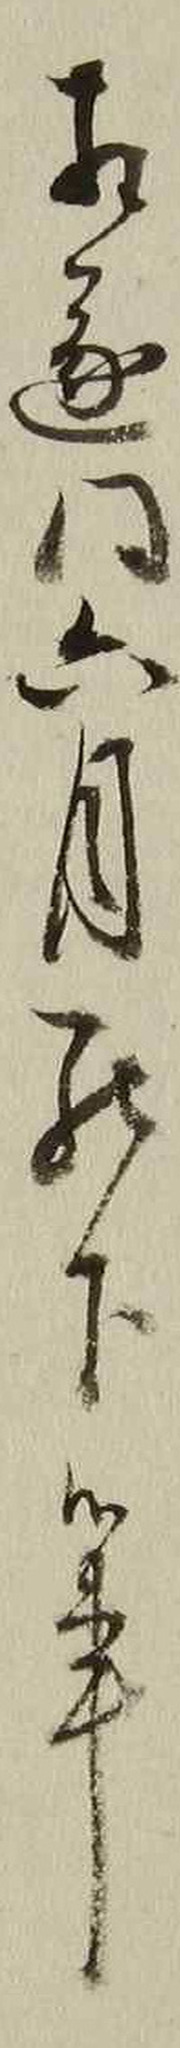相遂同六月罷下候事
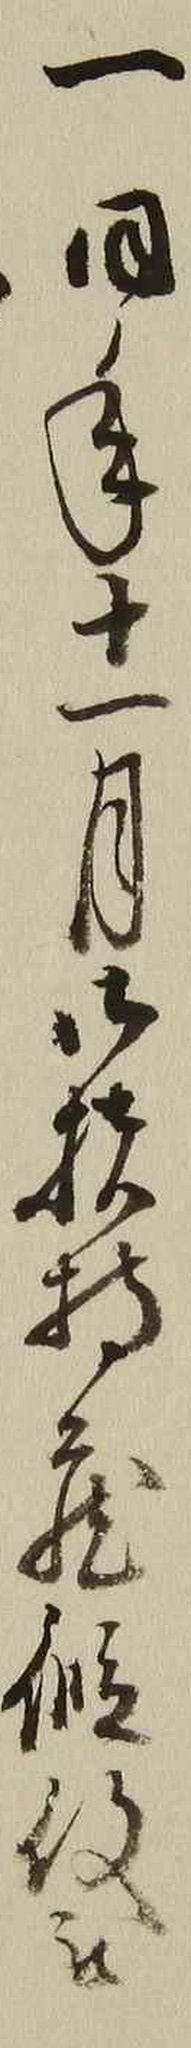一同年十一月御扶持蔵仮役被
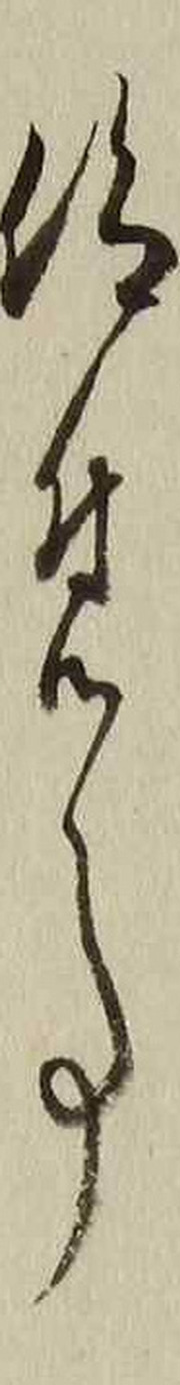仰付候事
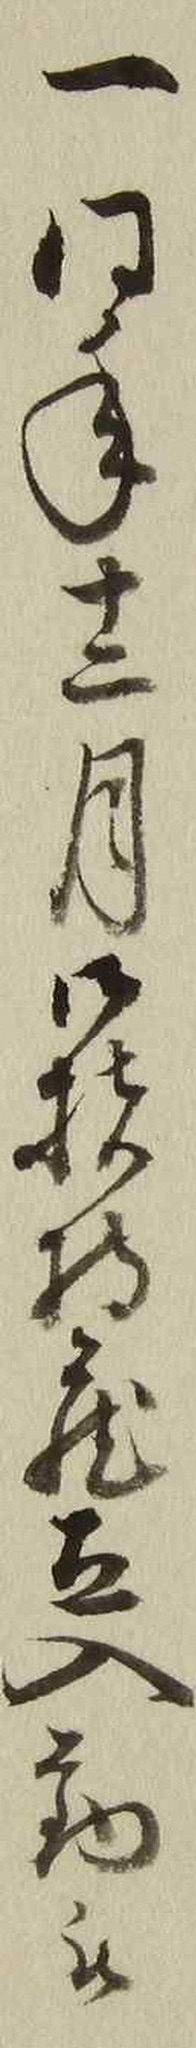一同年十二月御扶持蔵立入勤被
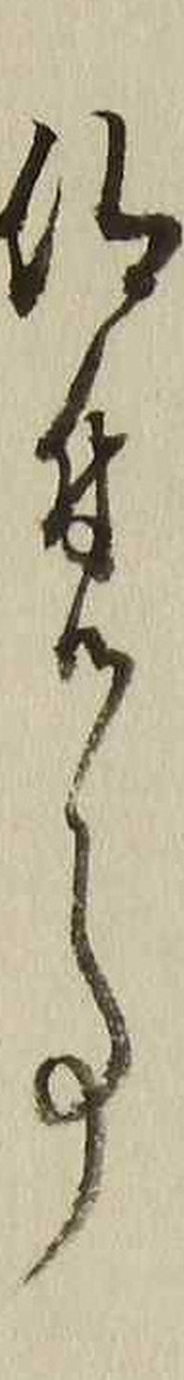仰付候事
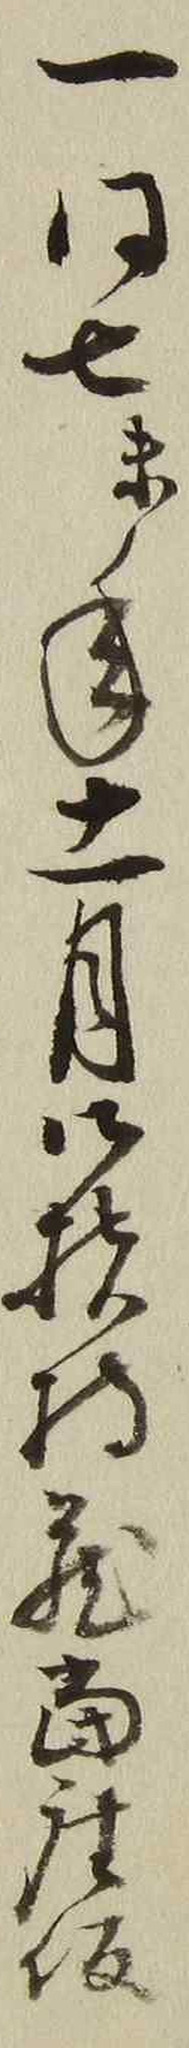一同七未年十一月御扶持蔵当座仮
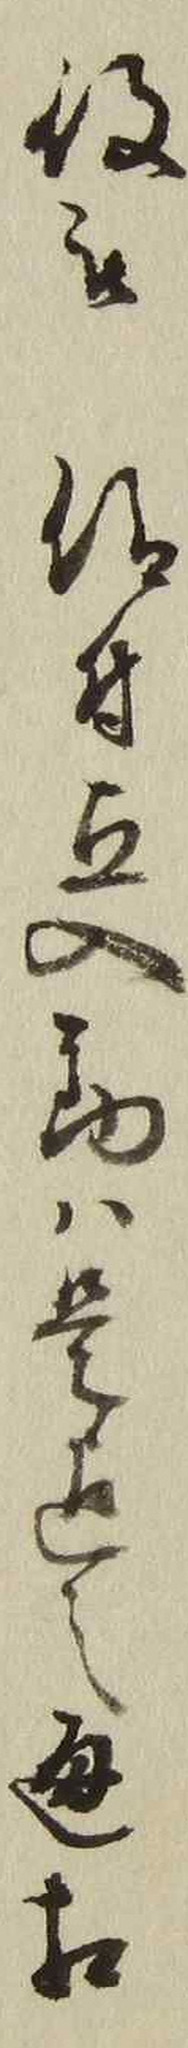役被仰付立入勤ハ是迄之通相
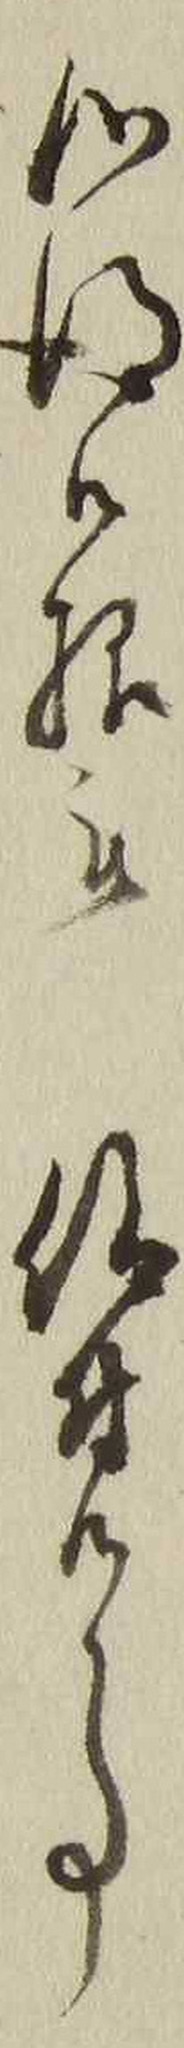心得候様被仰付候事
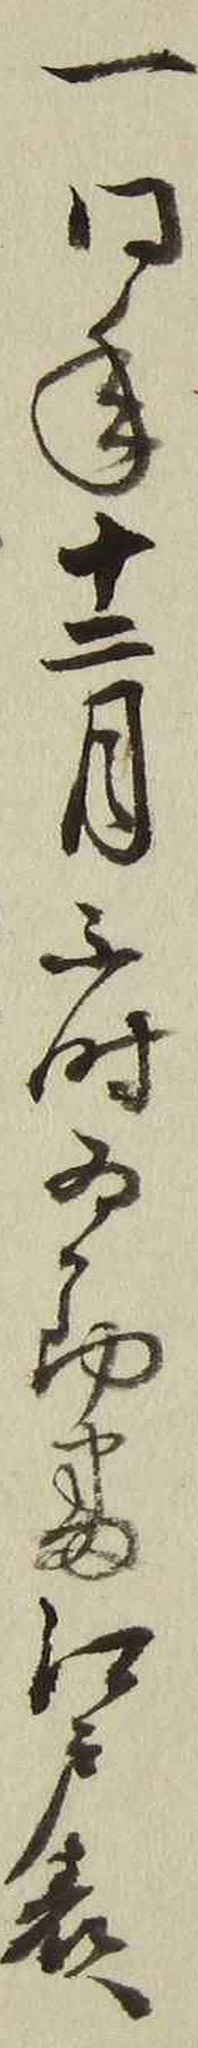一同年十二月不時為勤番江戸表へ
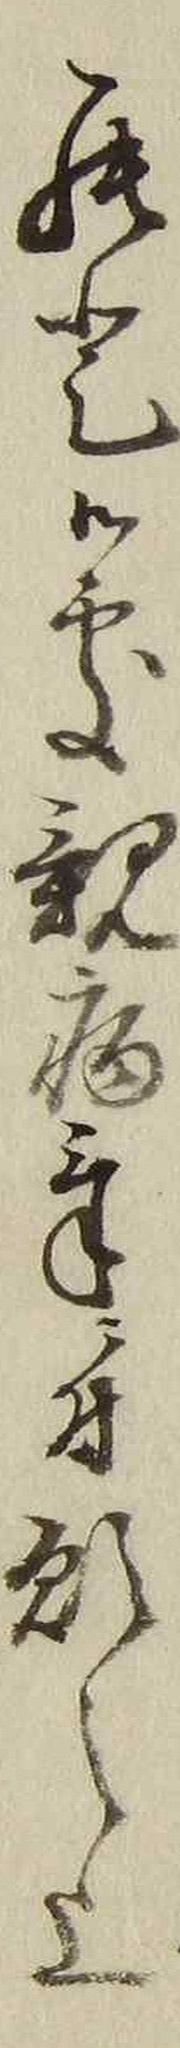罷登候処親病気付ニ願之上
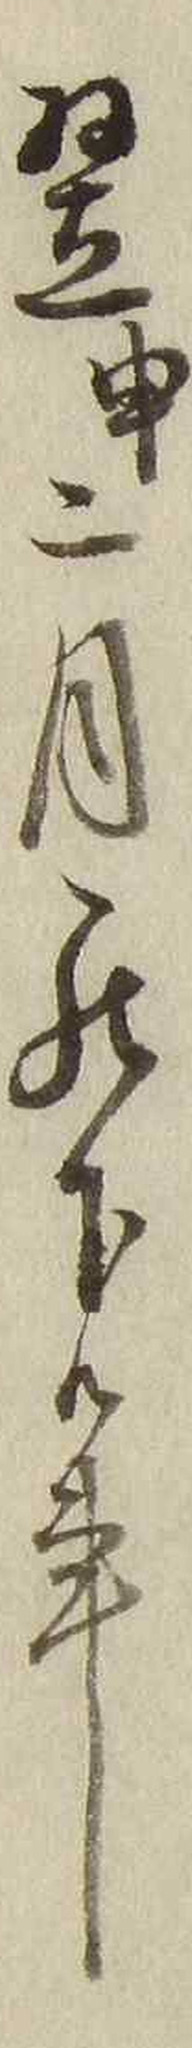翌申二月罷下候事

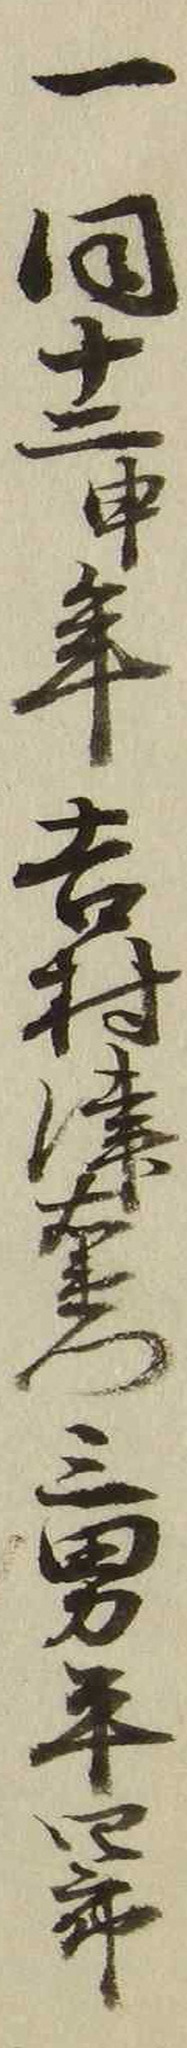一同十二申年吉村津右衛門三男平四郎
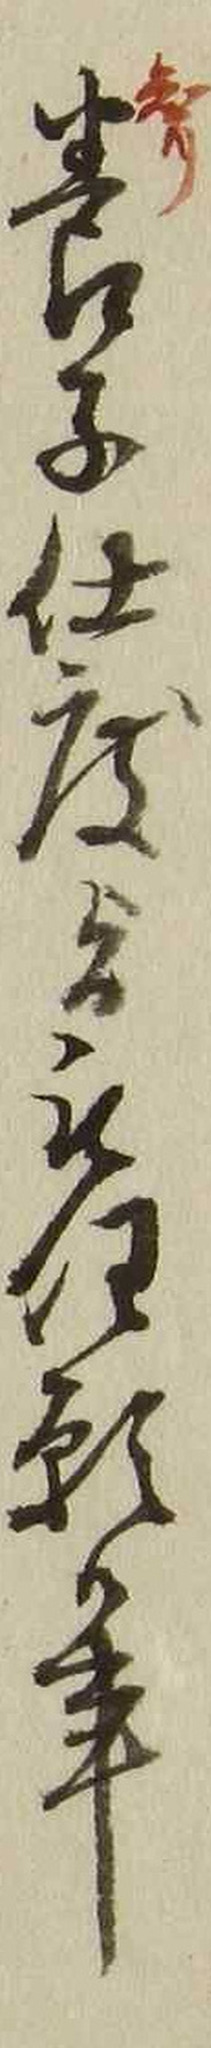養子仕度ゟ取任願候事
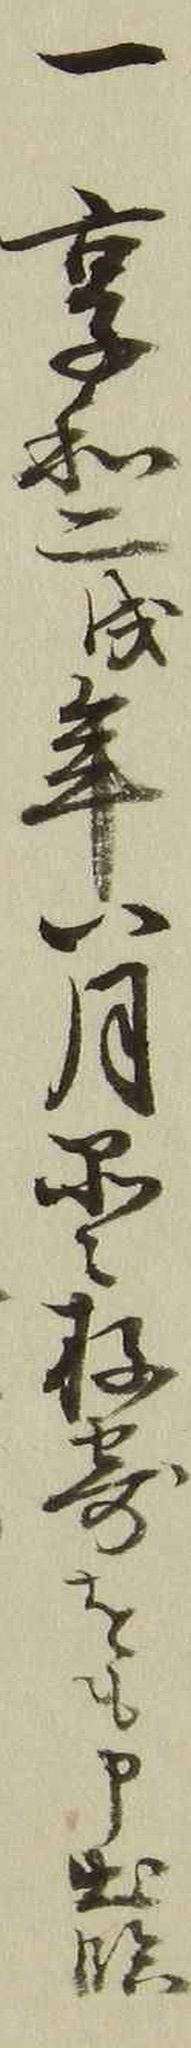一享和二戌年八月品々存寄をも申出臨
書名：諸士系譜　巻之39　は之部7
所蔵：会津若松市立会津図書館
